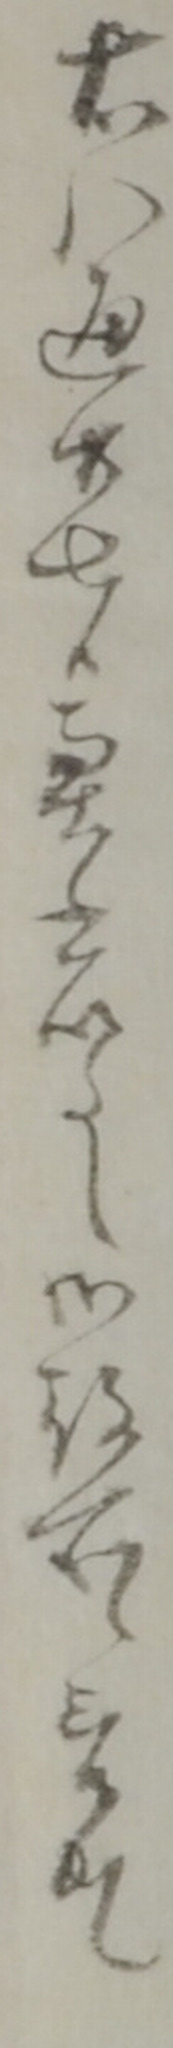右八通廿七日奥書いたし御役所へ差出候

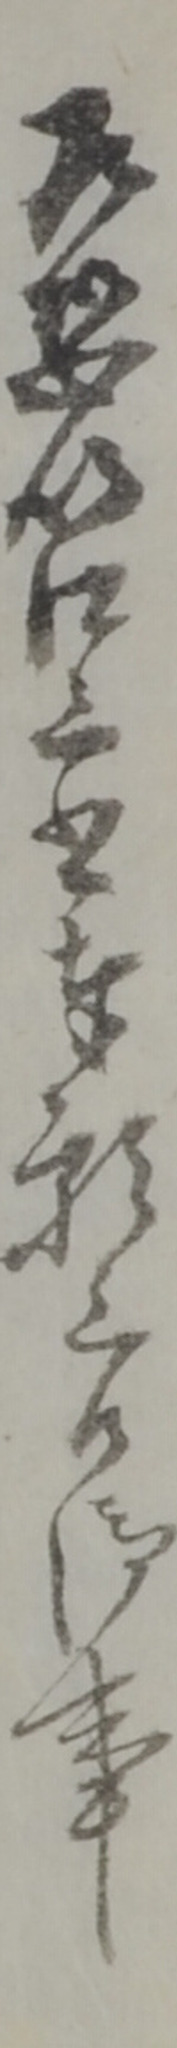乍恐以口上書奉願上候御事
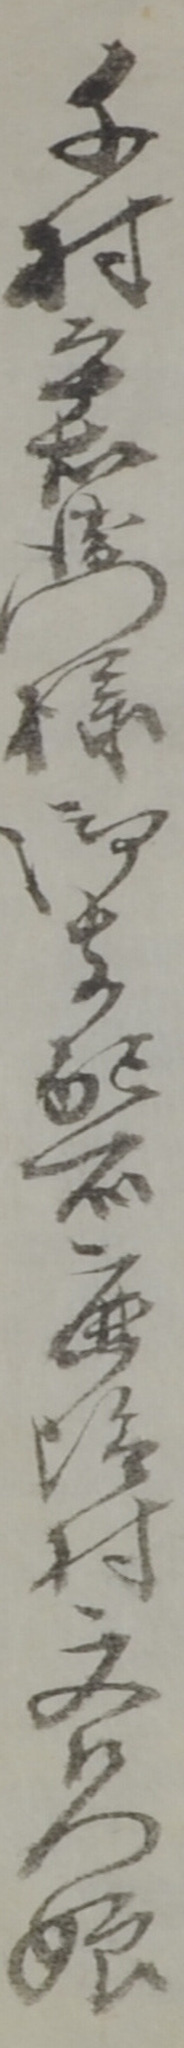千村平右衛門様御支配所鹿塩村文右衛門娘
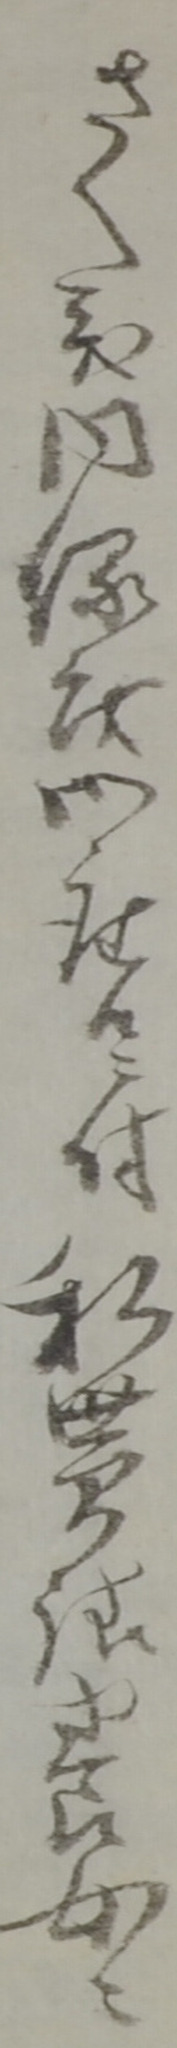さく義内縁も御座候ニ付私貰請養女ニ
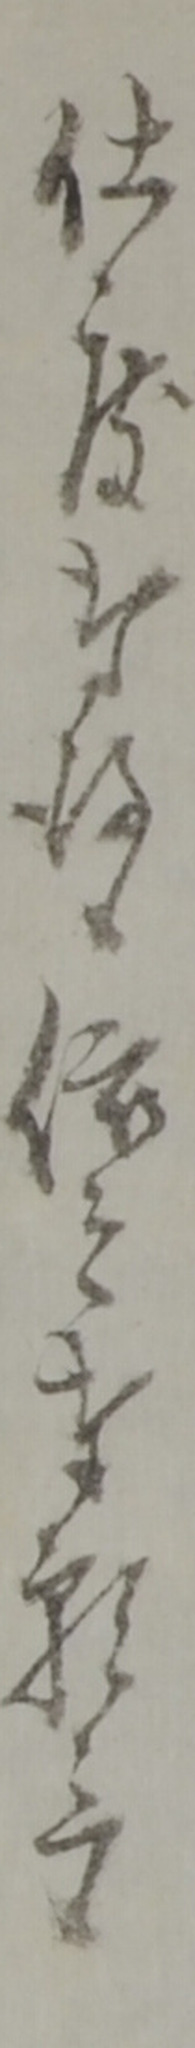仕度奉存候依之奉願上候
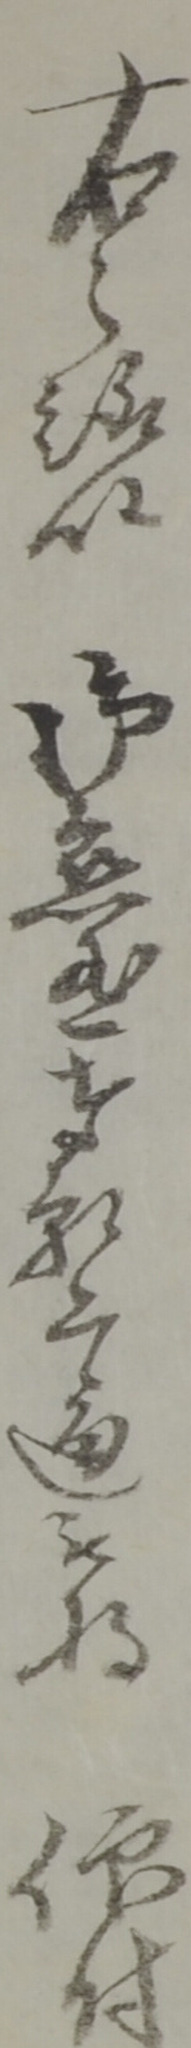右之趣以御慈悲奉願上候通被為仰付
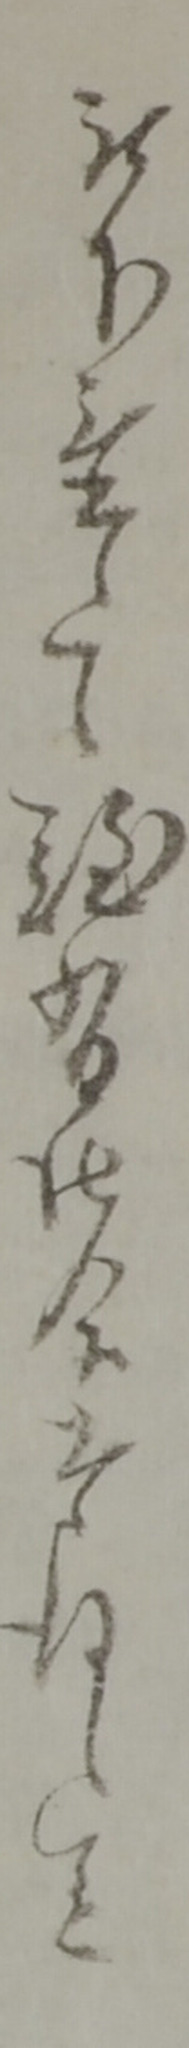被下置候ハヽ難有仕合奉存候以上
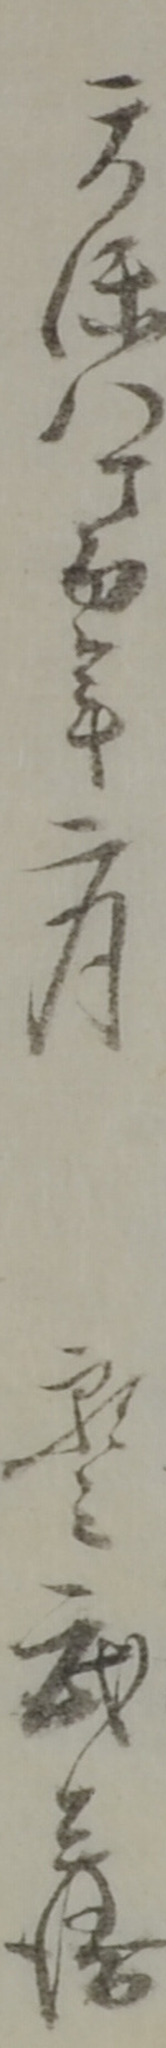天保八丁酉年二月願主武兵衛
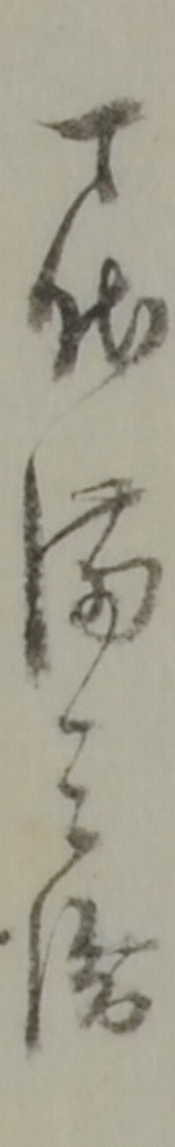町代満兵衛
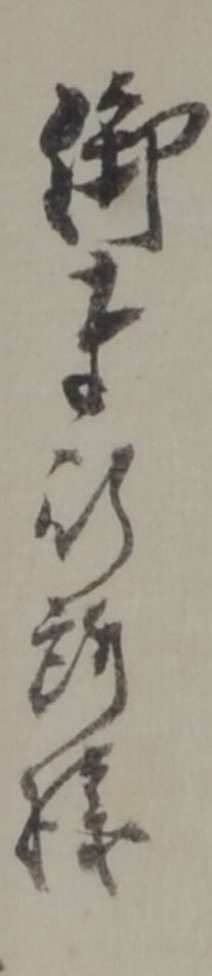御奉行所様
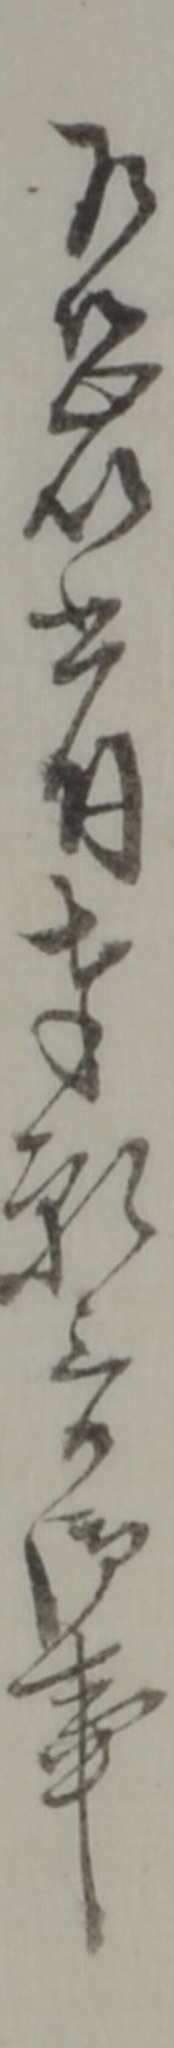乍恐以書付奉願上候御事
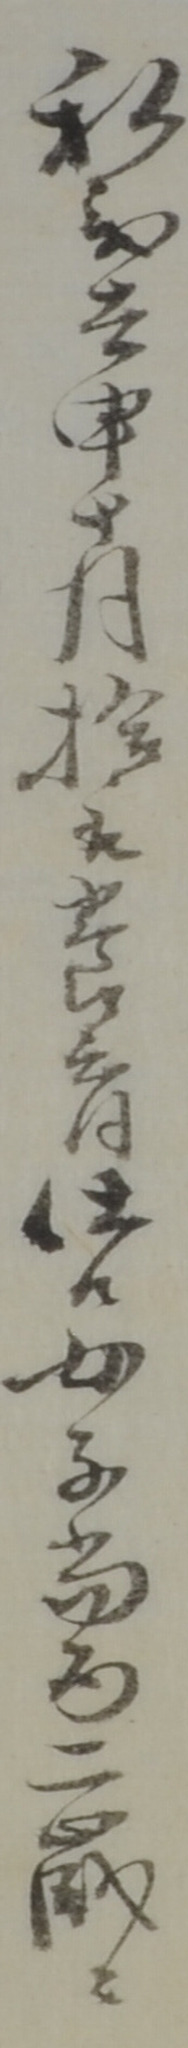私義去申十月拾取養育仕ル女子当酉二歳ニ
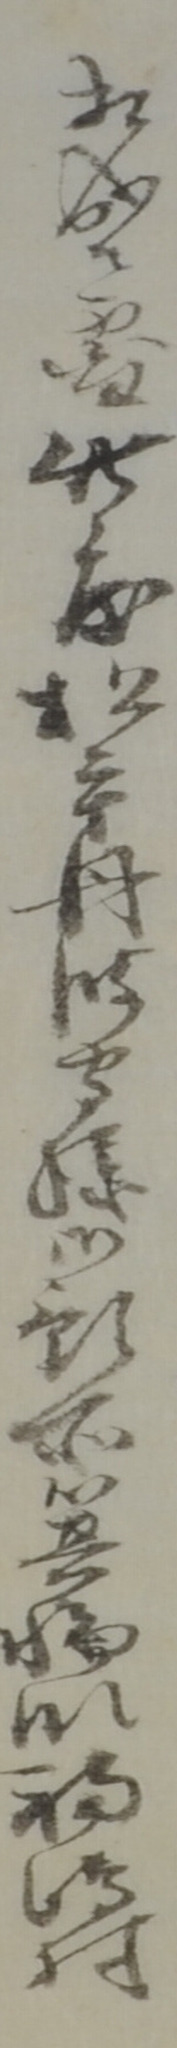相成候処此度松平丹波守様御領所箕輪町福島村
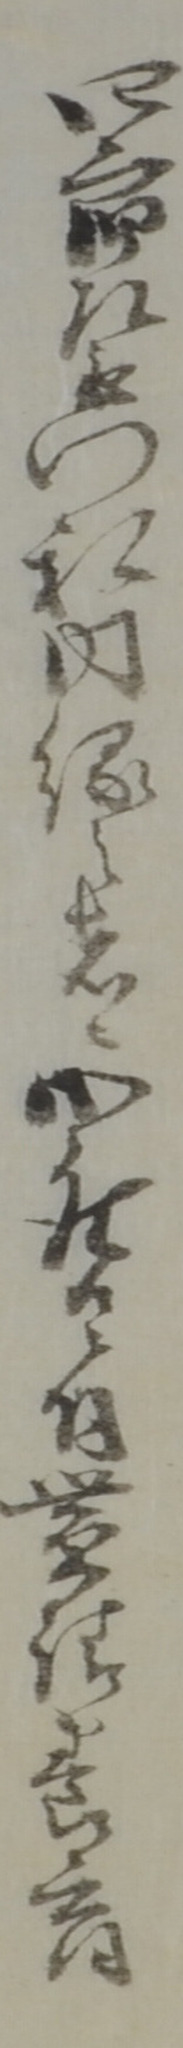四郎左衛門私内縁之者ニ御座候ニ付貰請養育
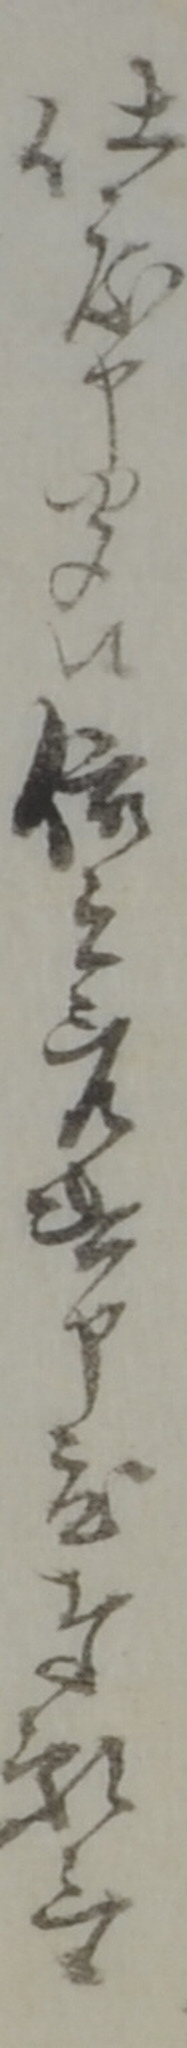仕度申聞候依之差遣申度奉願上候
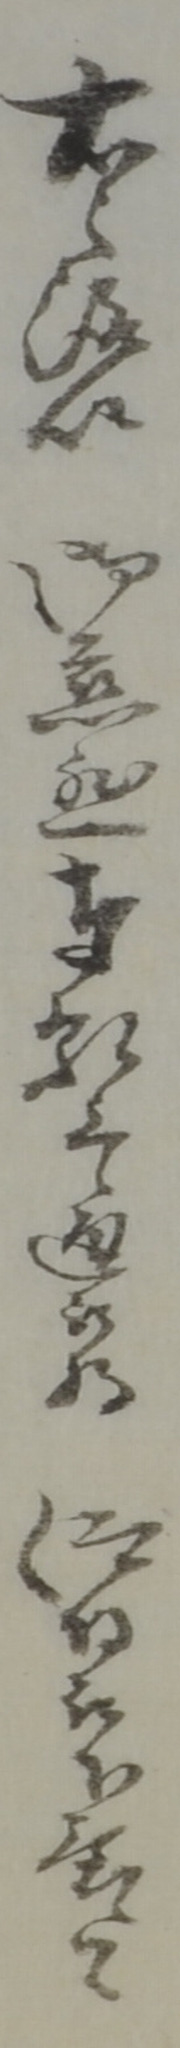右之趣以御慈悲奉願上候通被為仰付被下置候ハヽ
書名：諸願書控帳
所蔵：伊那市立高遠町図書館・合同会社AMANE
